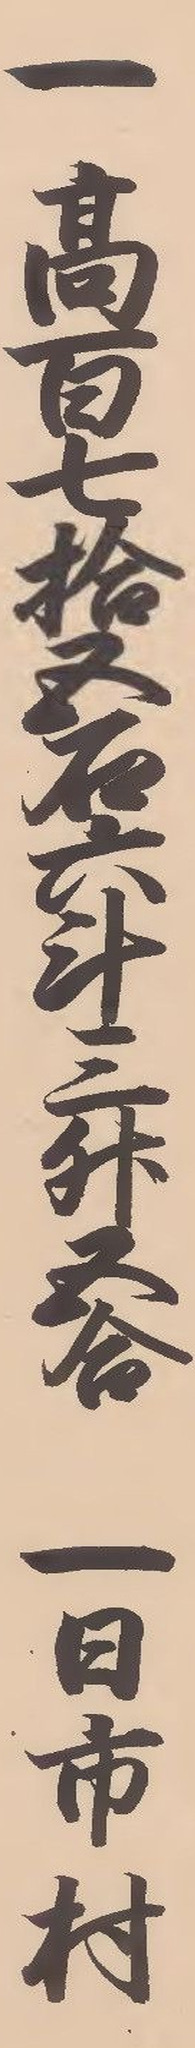一高百七拾五石六斗三升五合一日市村

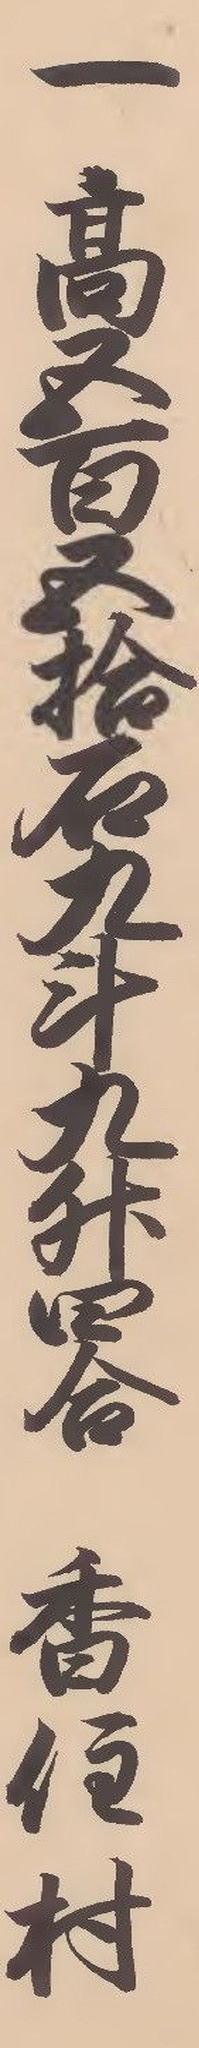一高五百五拾石九斗九升四合香住村
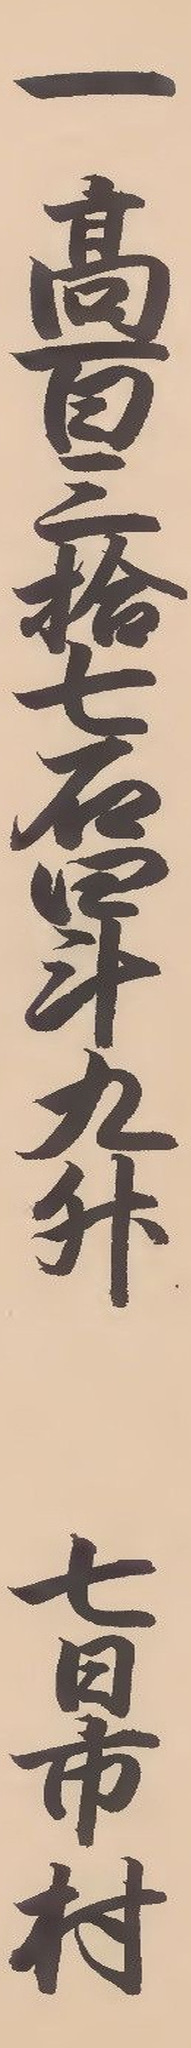一高百三拾七石四斗九升七日市村
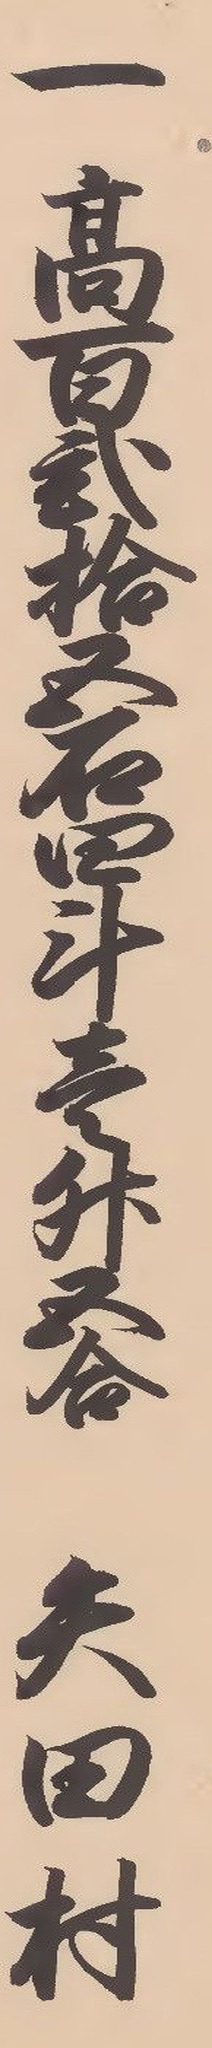一高百弐拾五石四斗壱升五合矢田村
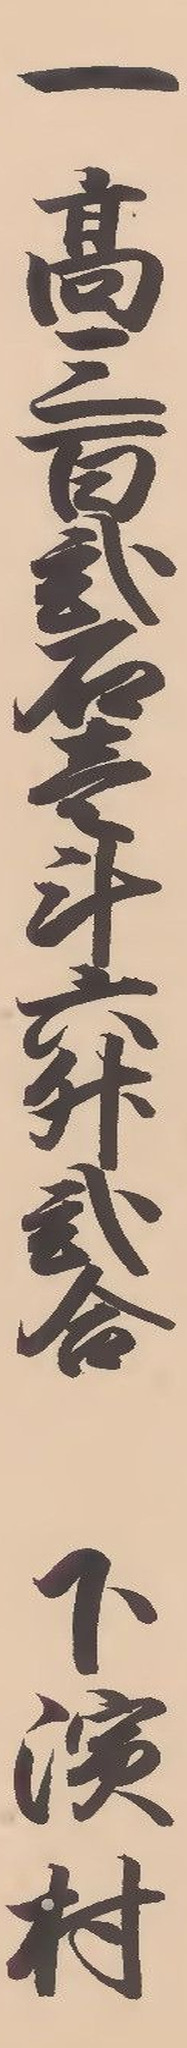一高三百弐石壱斗六升弐合下浜村
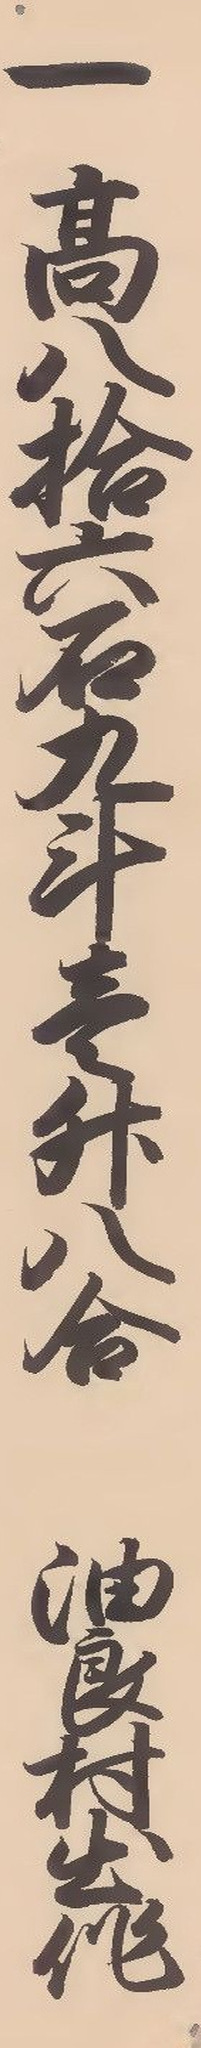一高八拾六石九斗壱升八合油良村出作
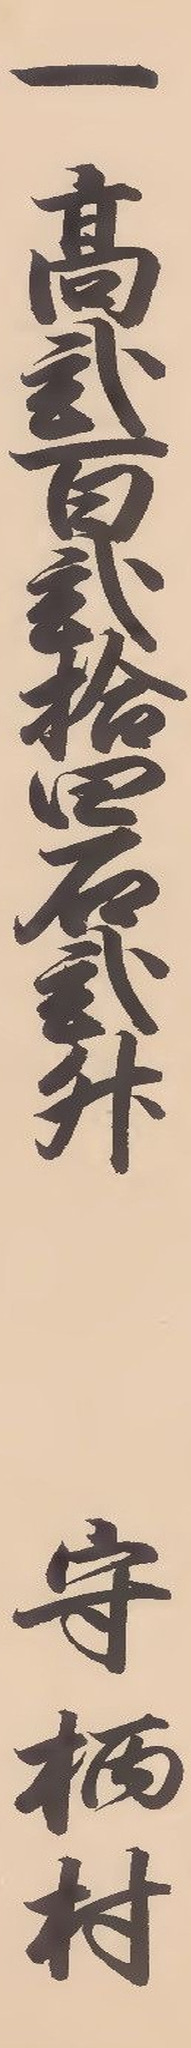一高弐百弐拾四石弐升守栖村
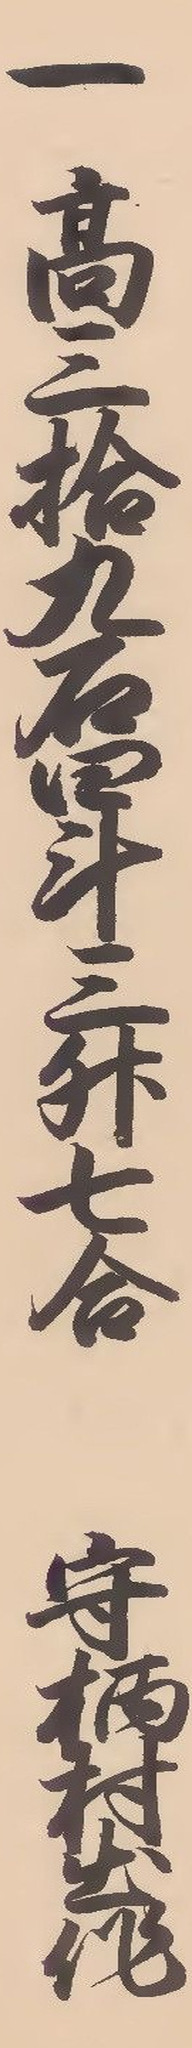一高三拾九石四斗三升七合守栖村出作

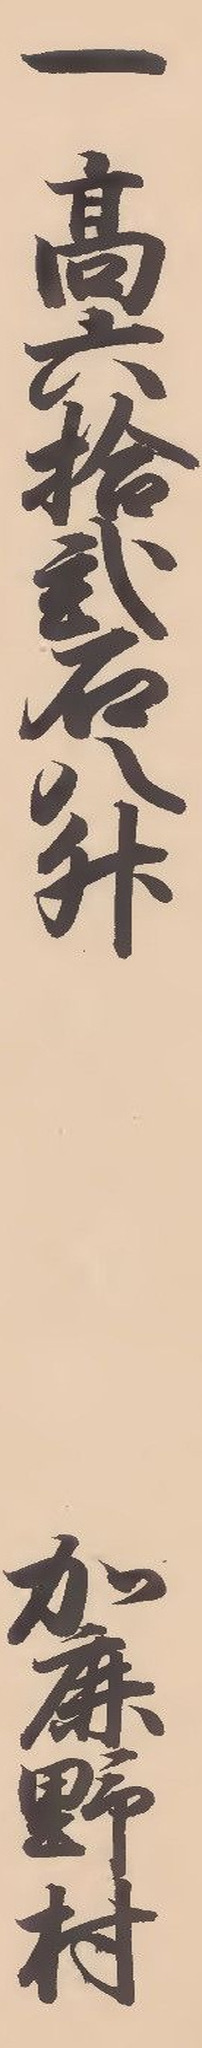一高六拾弐石八升加鹿野村
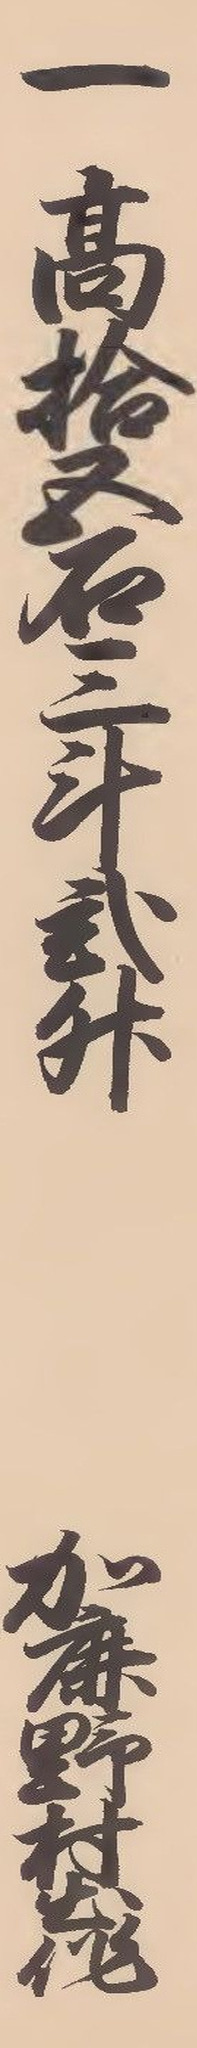一高拾五石三斗弐升加鹿野村出作
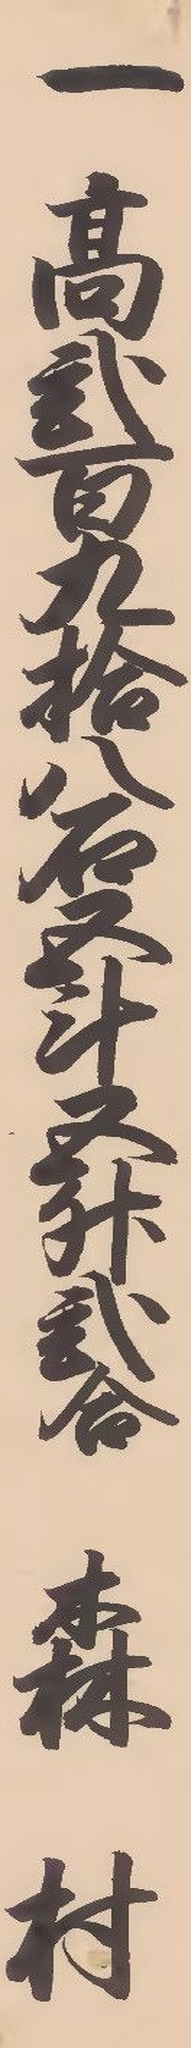一高弐百九拾八石五斗五升弐合森村
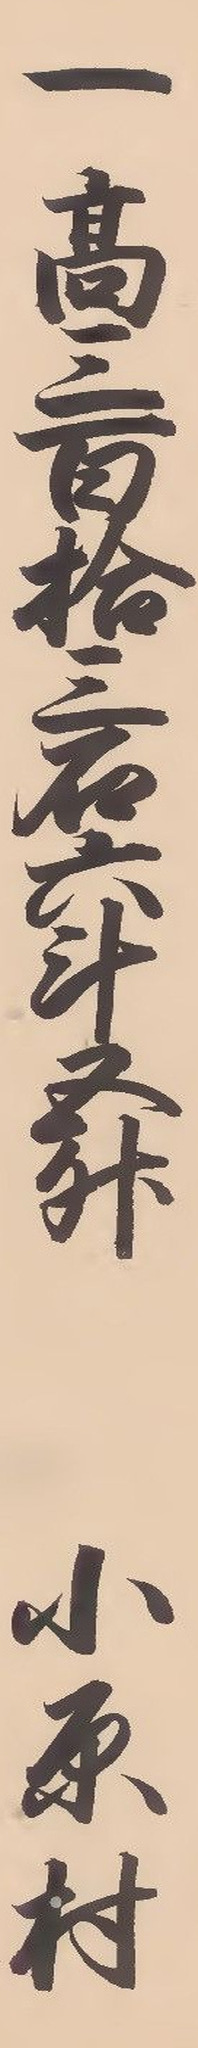一高三百拾三石六斗五升小原村
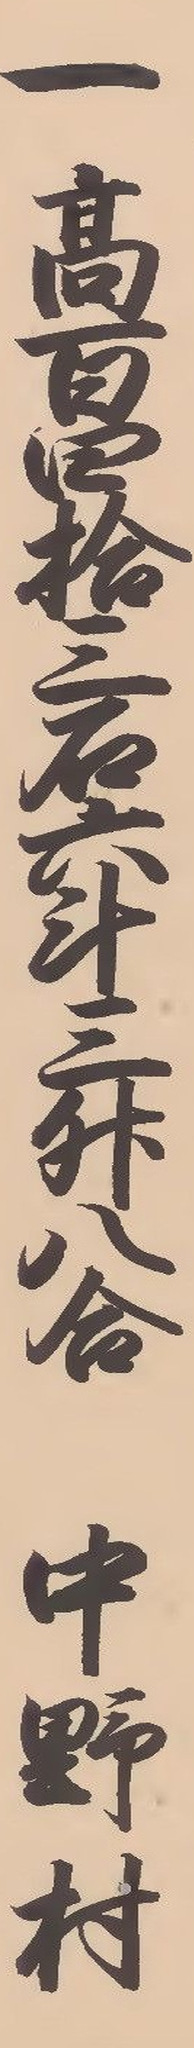一高百四拾三石六斗三升八合中野村
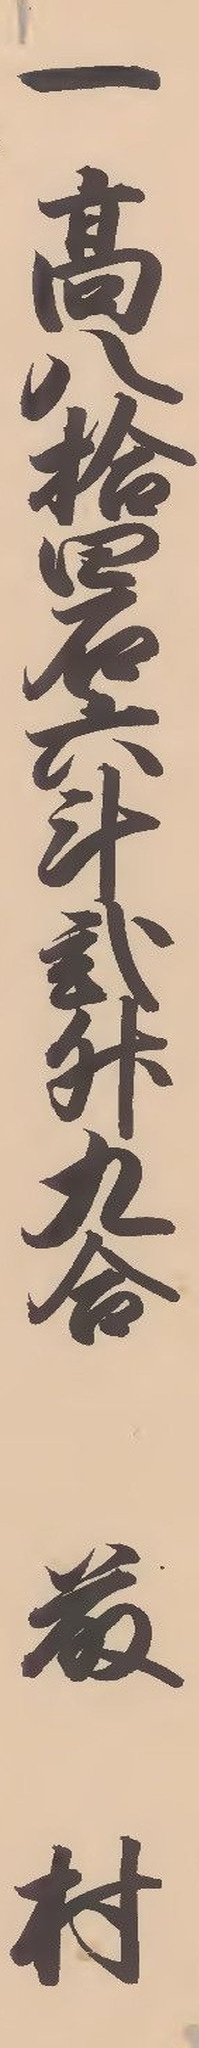一高八拾四石六斗弐升九合藤村
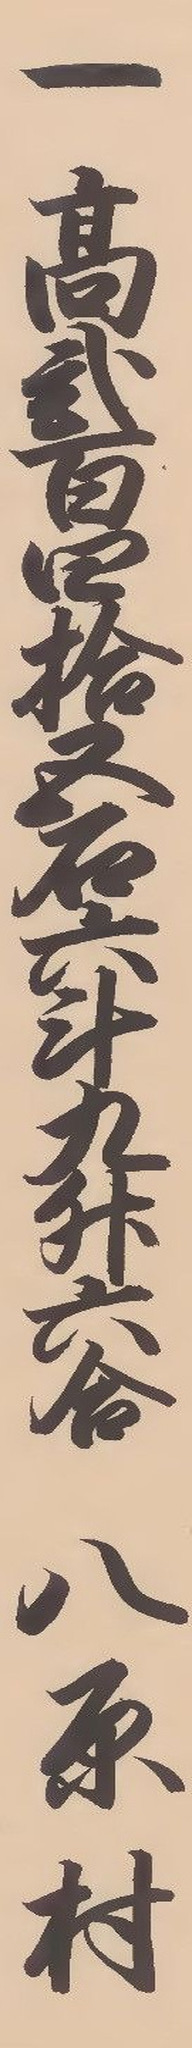一高弐百四拾五石六斗九升六合八原村
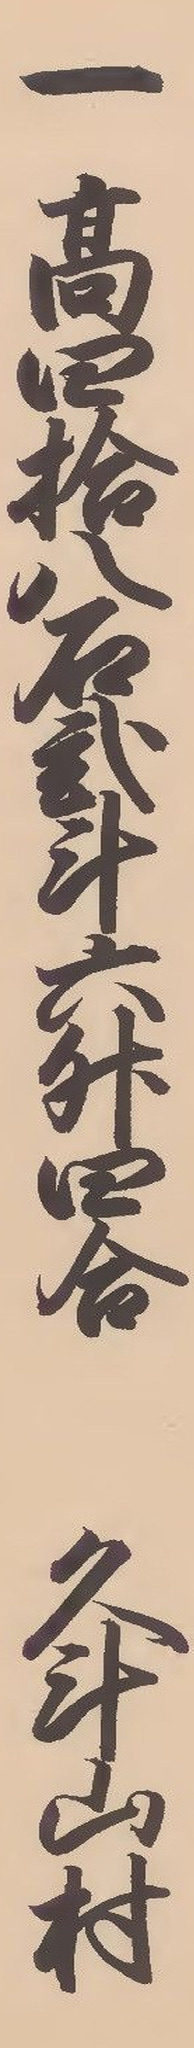一高四拾八石弐斗六升四合九斗山村
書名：但馬国郷帳
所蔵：国立公文書館 National Archives of Japan
